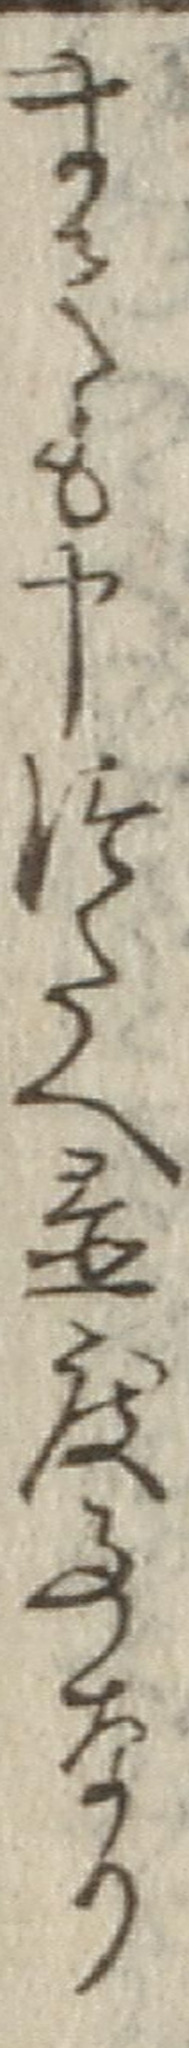まても申つたへ置度事なり
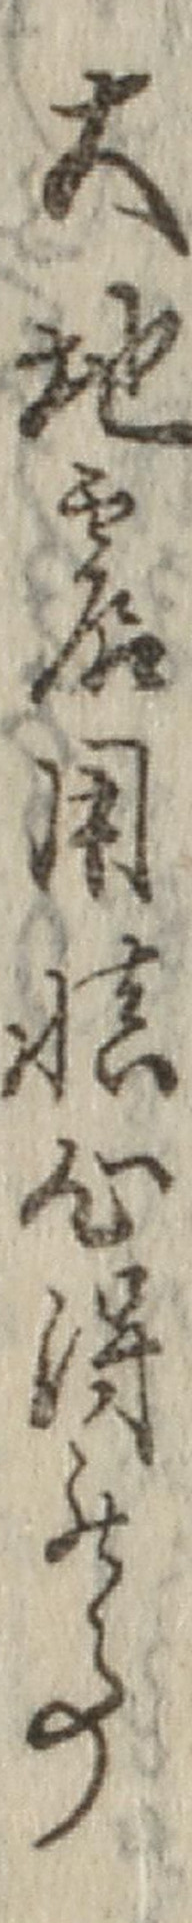大地震用慎心得の事
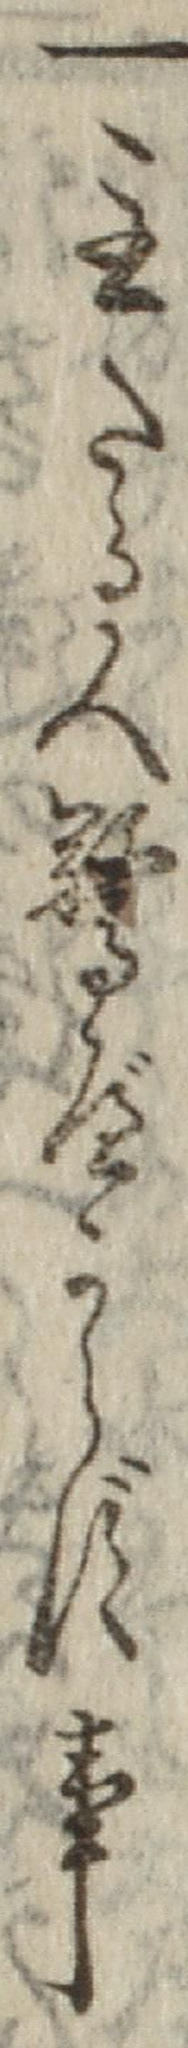一主たる人驚べからず事
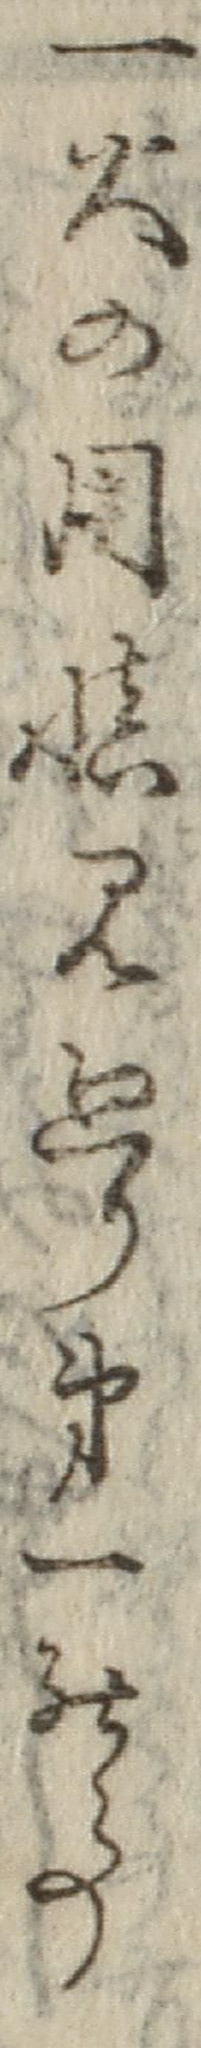一火の用慎見廻り第一の事
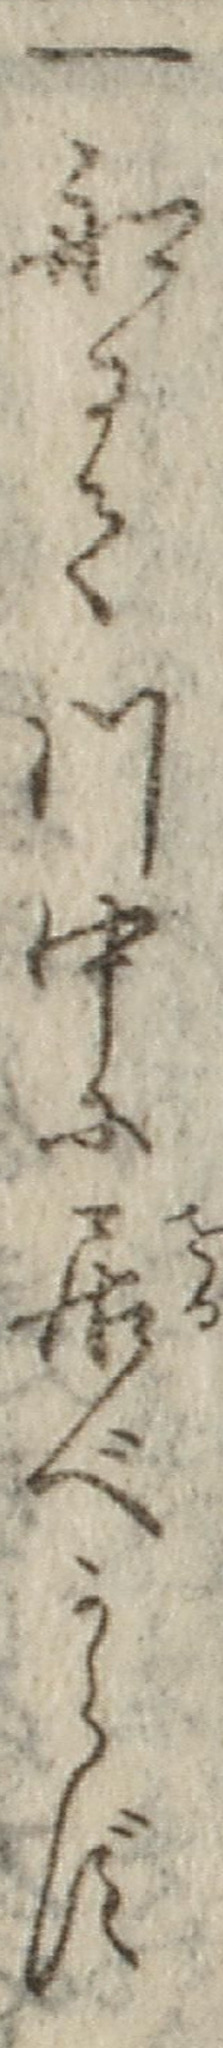一船にて川中に居べからず
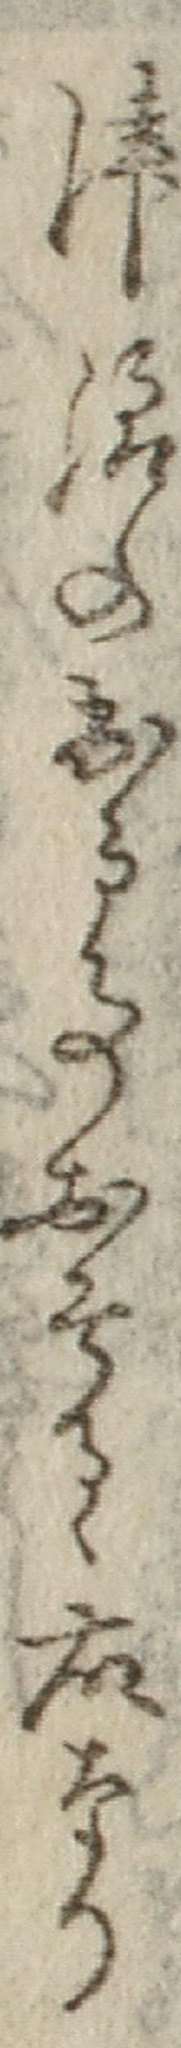津浪の出る事おそるゝ故なり
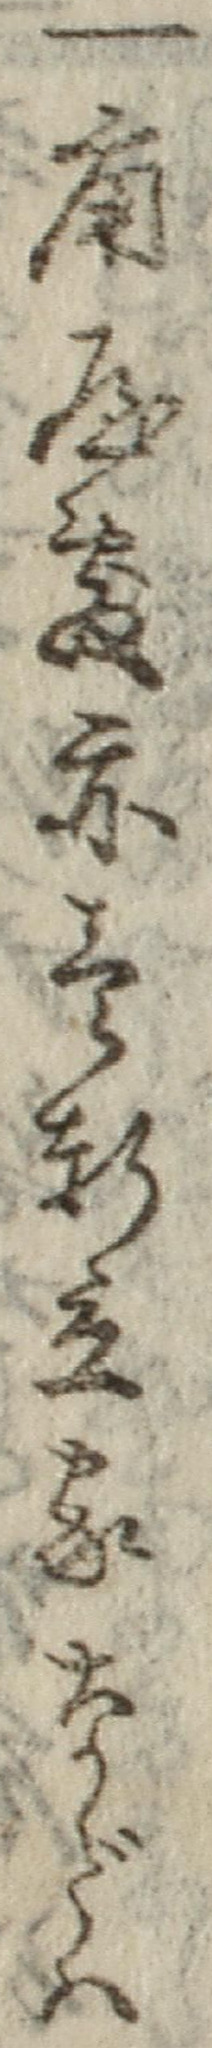一角屋敷亦壱軒立家などハ
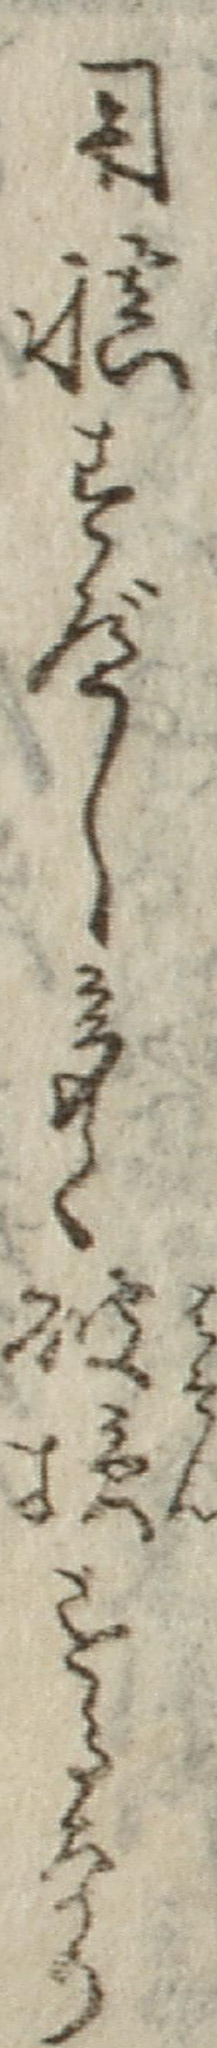用慎すべし多く破損するなり
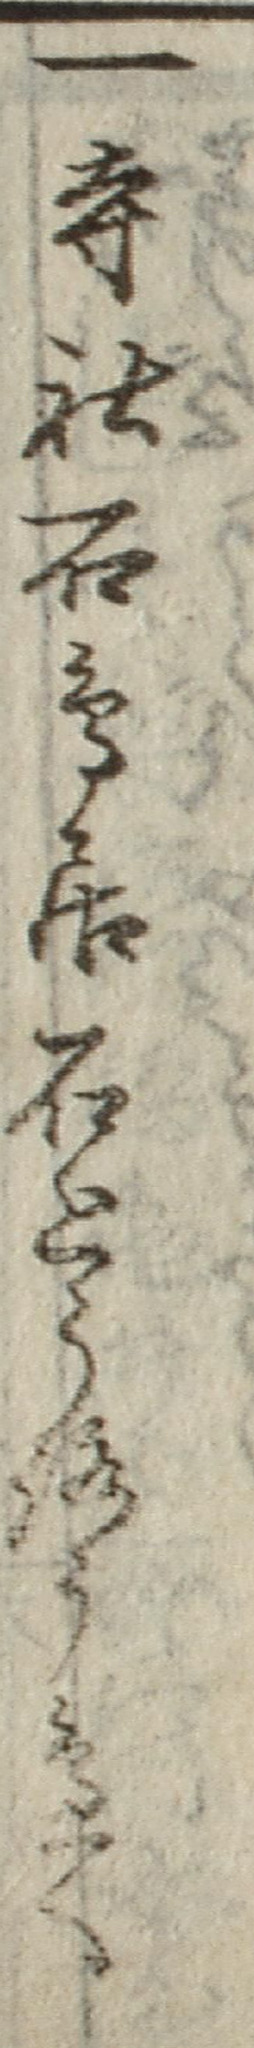一寺社石鳥居石とうろう辺へ

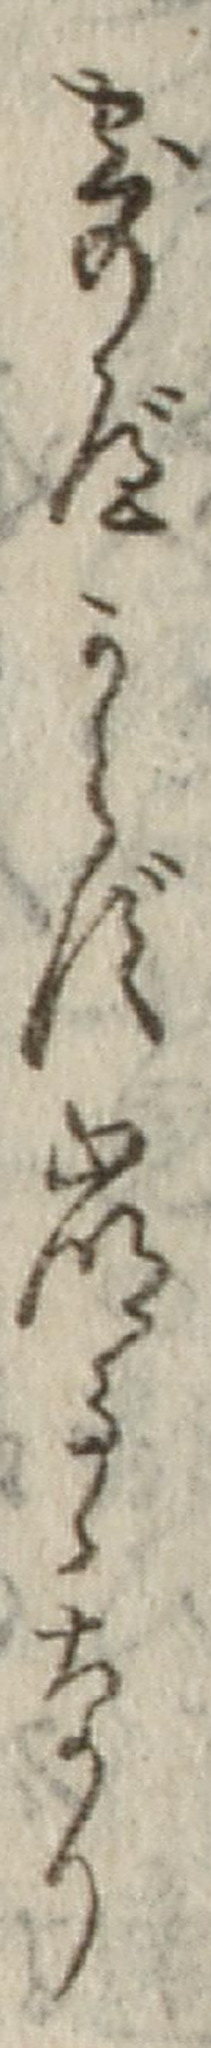寄べからず崩るゝなり
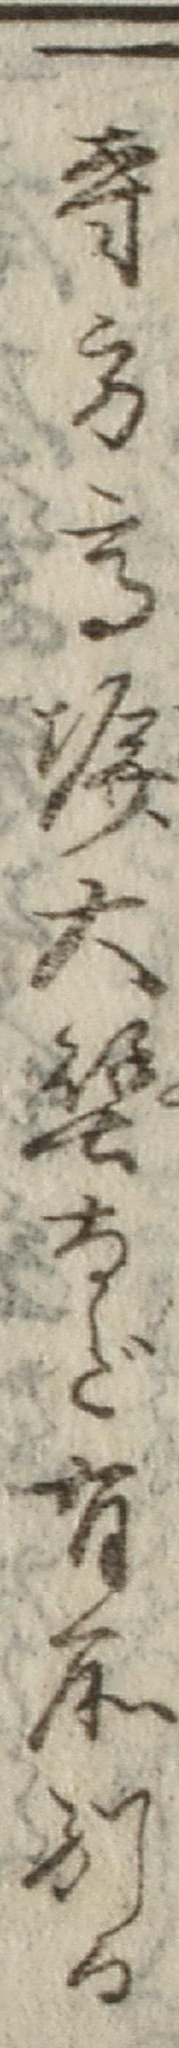一寺方高塀大壁など有所別而
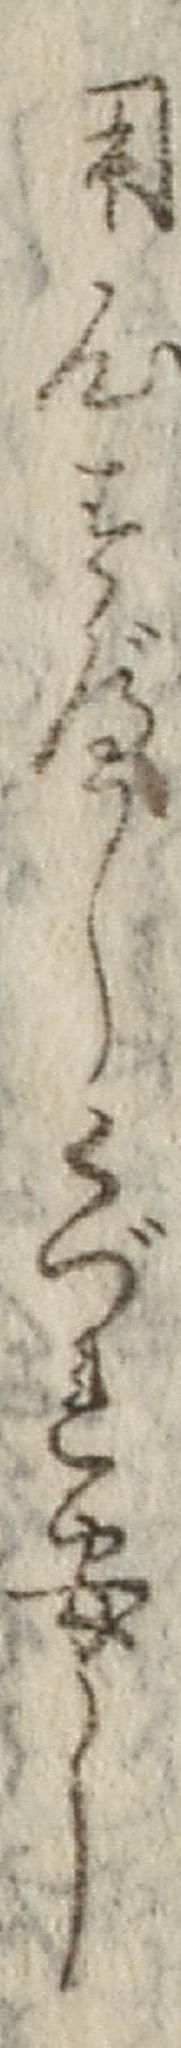用心すべしくづれ安し
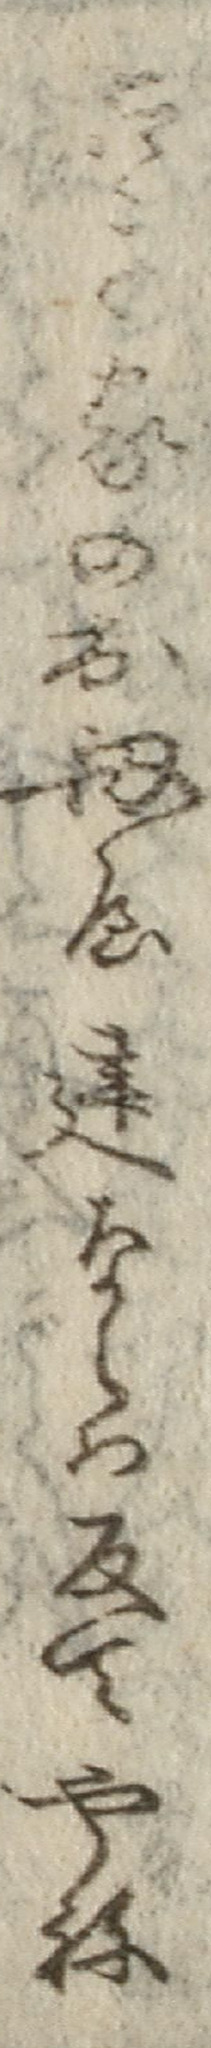き家のお母屋建ならハ反てやね
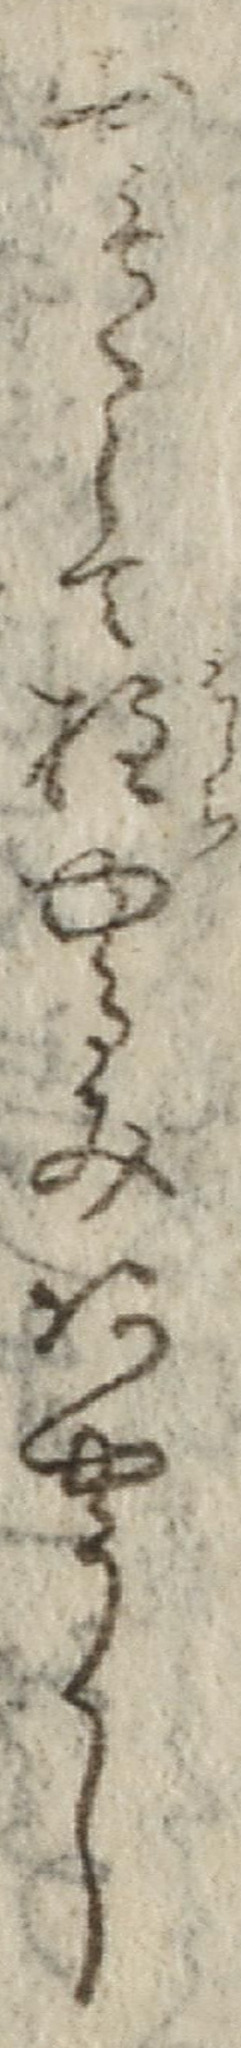おもくして柱ゆるみあやうし
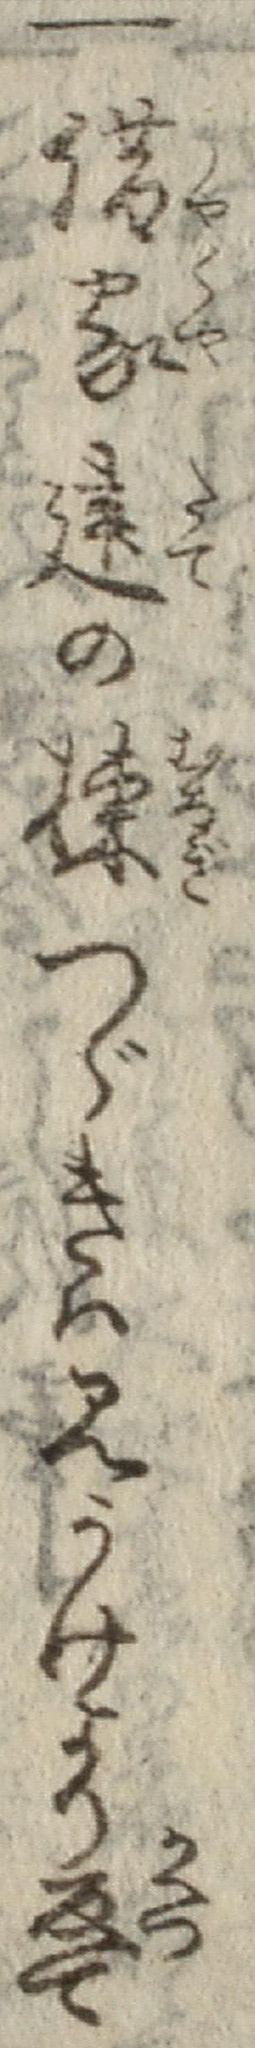一借家建の棟つゞきハ見かけより反て
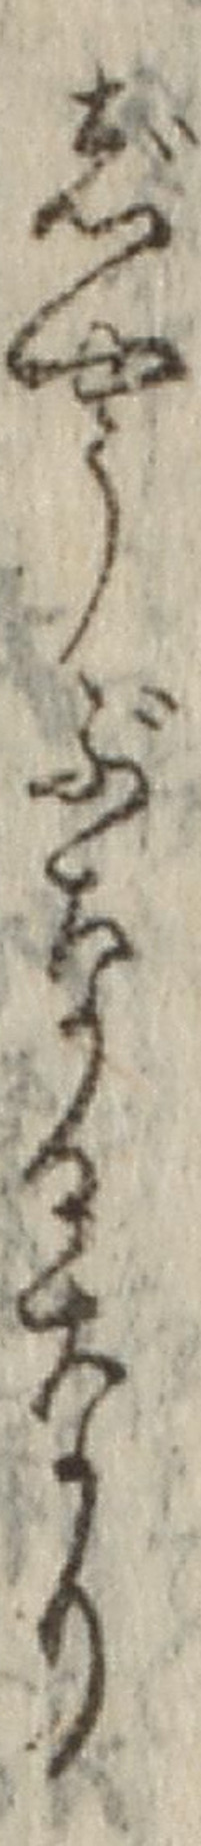じやうぶなるなり
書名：世直り艸紙
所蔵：東京大学地震研究所図書室 Earthquake Research Institute Library, The University of Tokyo, JAPAN
